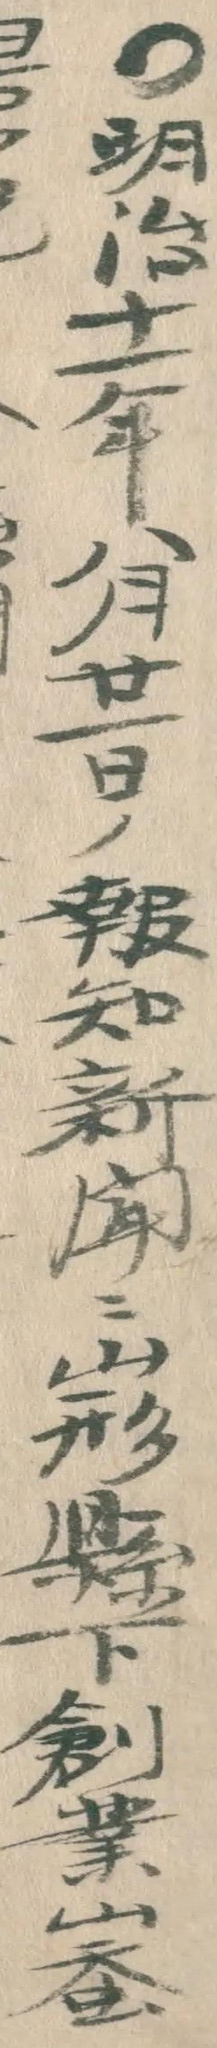○明治十一年八月廿一日の報知新聞に山形縣下創業山蚕
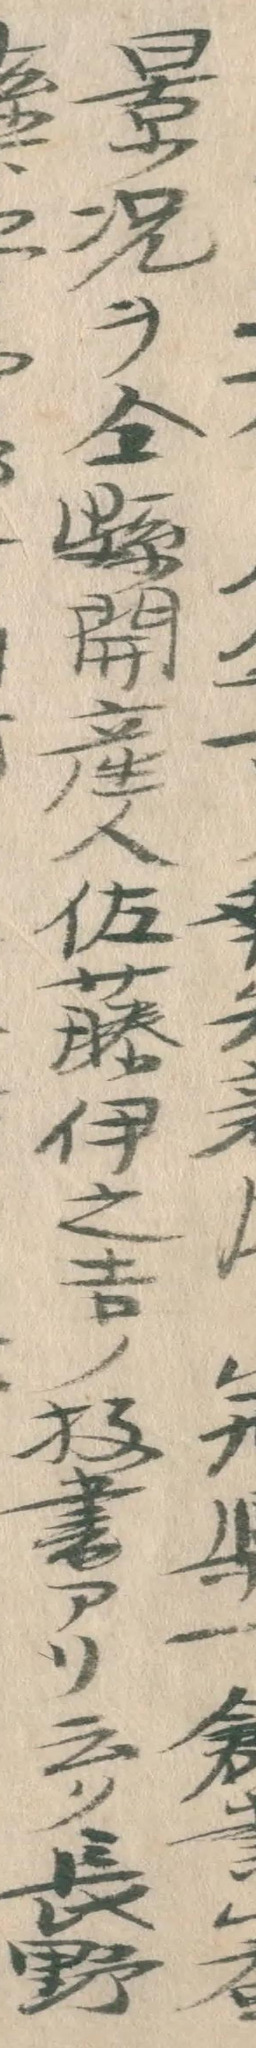景況を仝縣開産人佐藤伊之吉の扱書あり云く長野
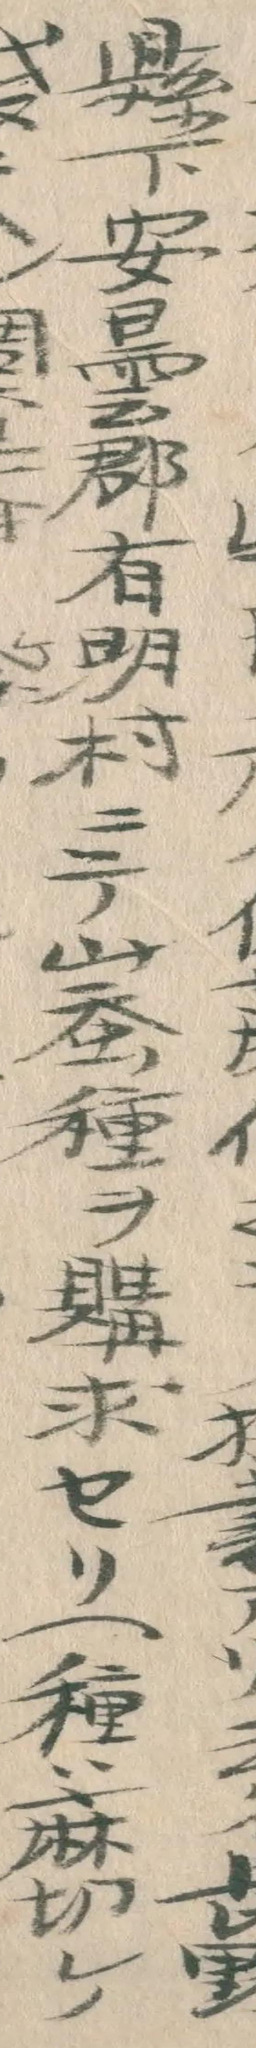縣下安曇郡有明村にて山蚕種を購求せり(種は麻切れの
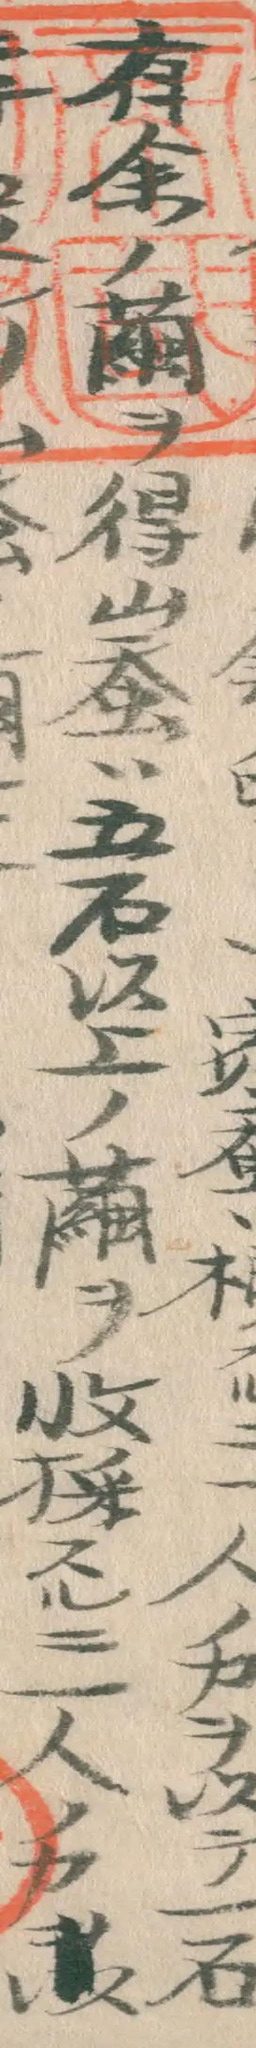有余の繭を得山蚕は五石以上の繭を収採するに一人の力
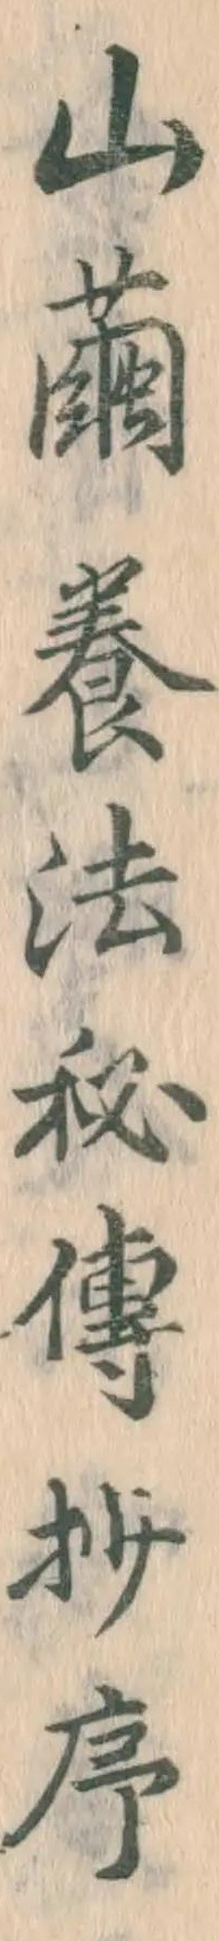山繭養法秘傳抄序

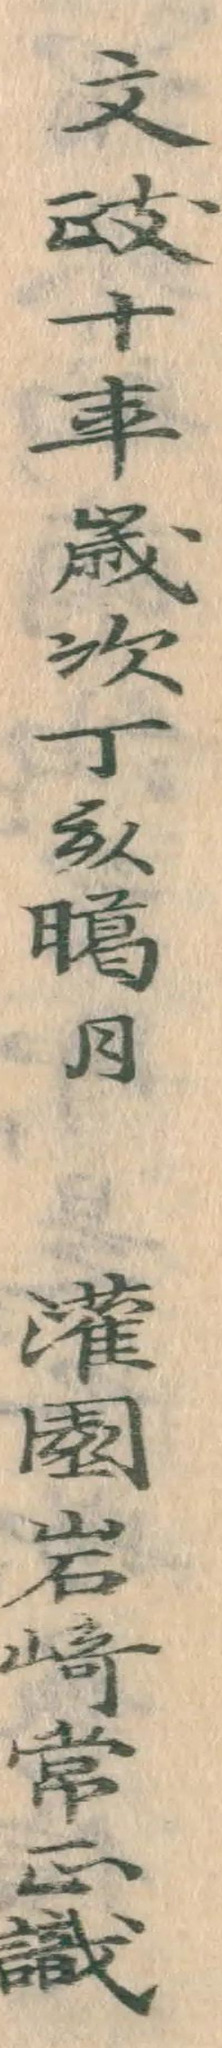文政十年歳次丁亥臈月灌園岩崎常正識
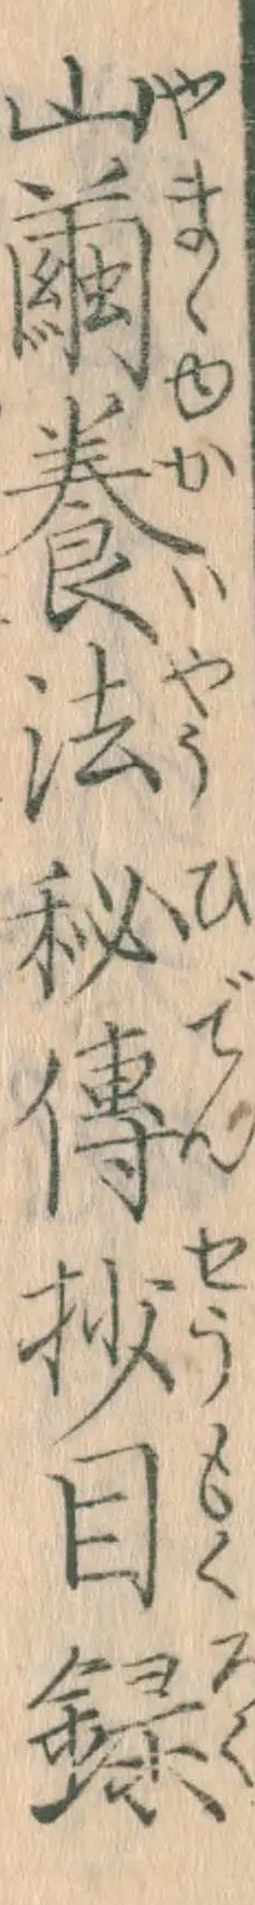山繭養法秘伝抄目録
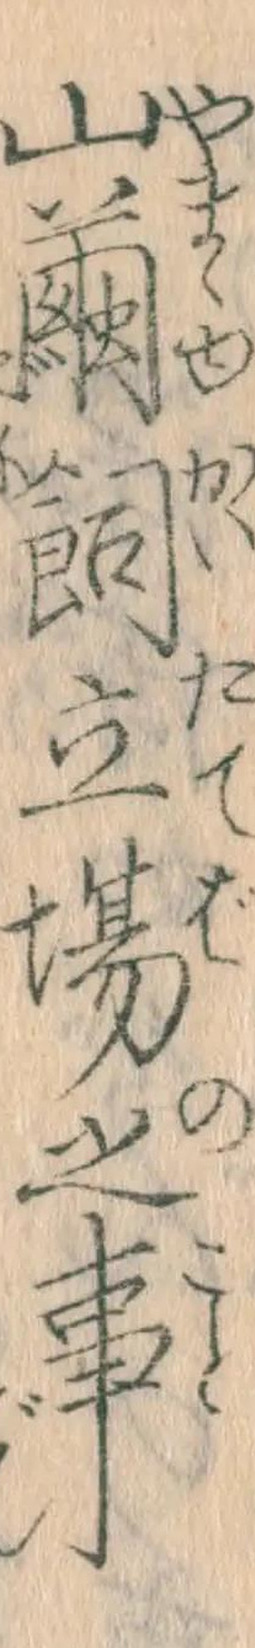山繭飼立場之事
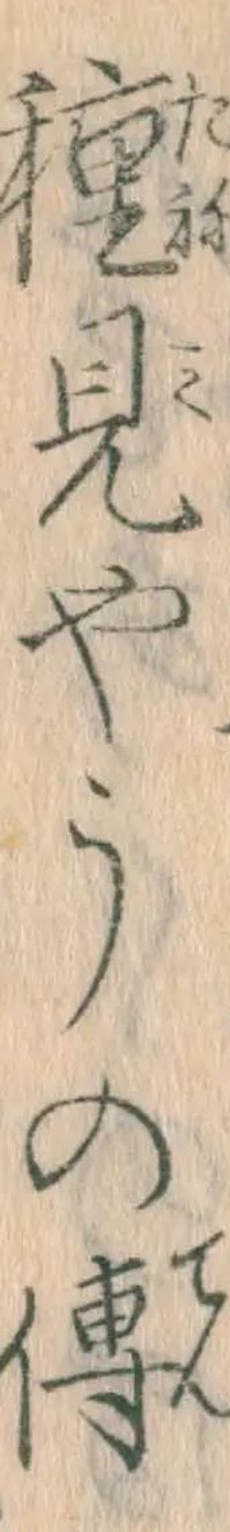種見やうの傳
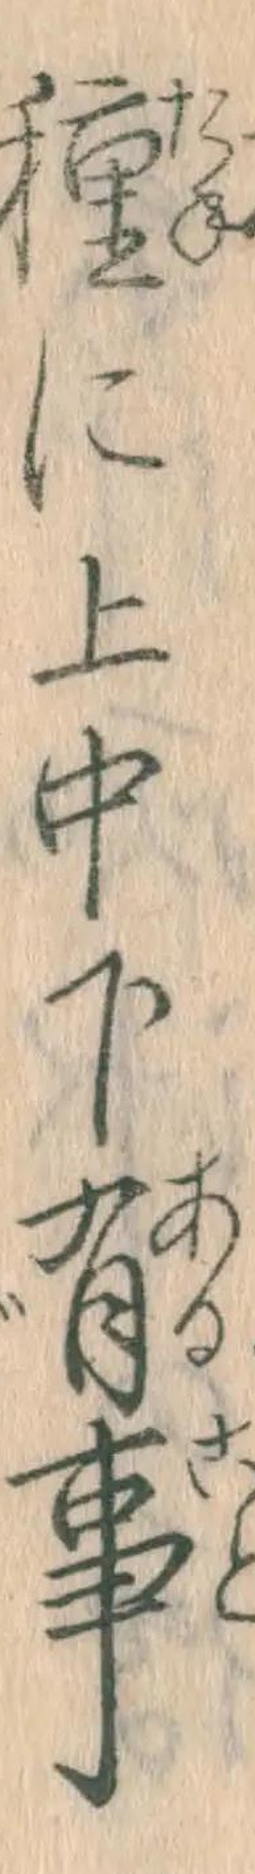種に上中下有事
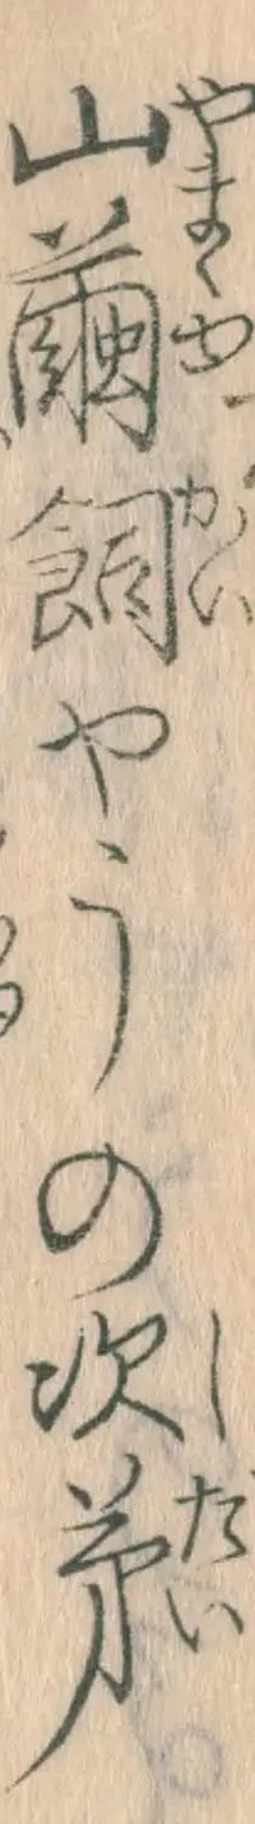山繭飼やうの次第
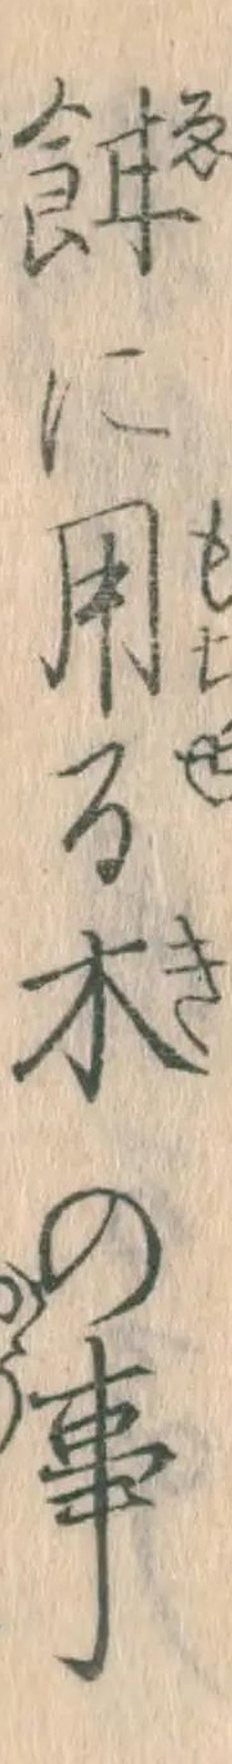餌に用る木の事
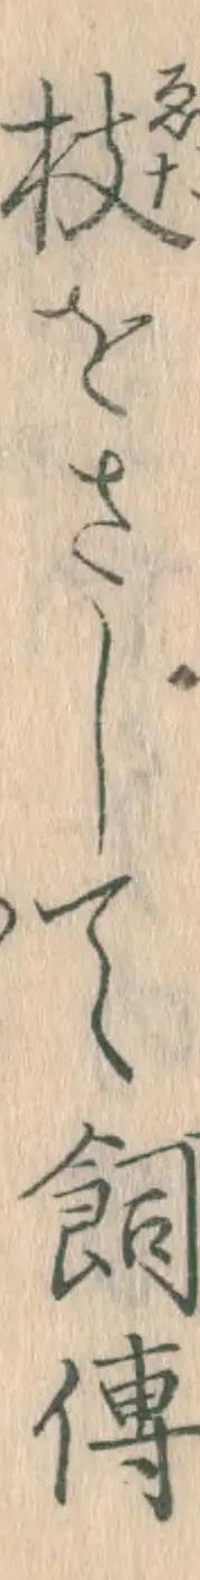枝をさして飼傳
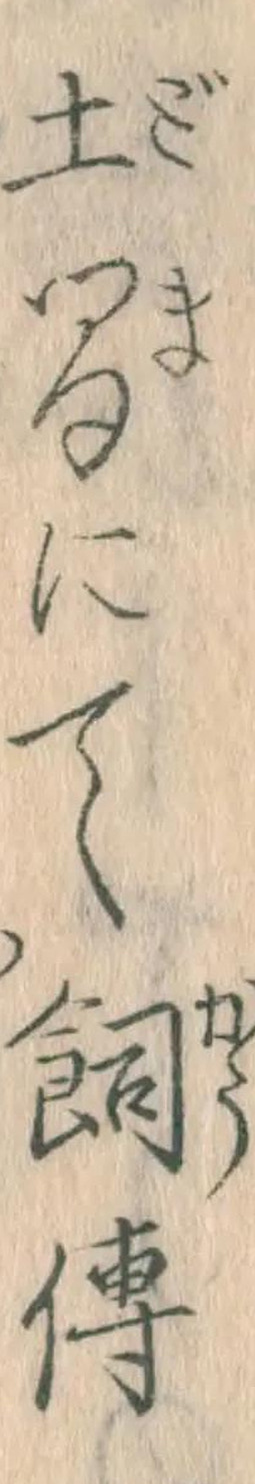土間にて飼傳
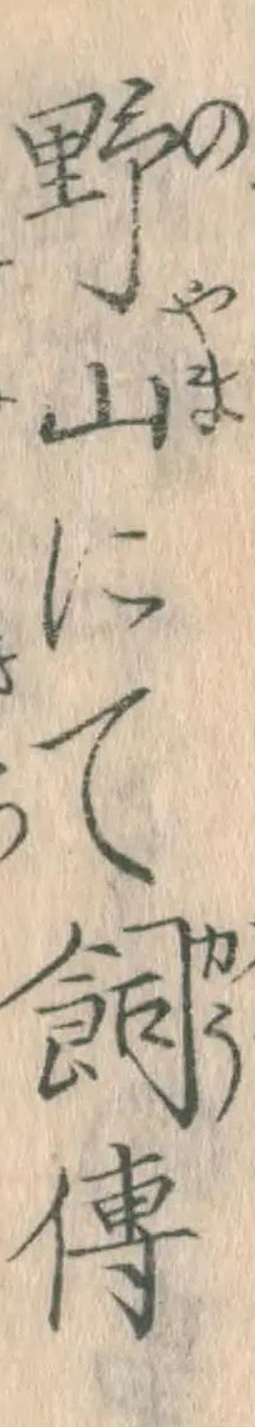野山にて飼傳
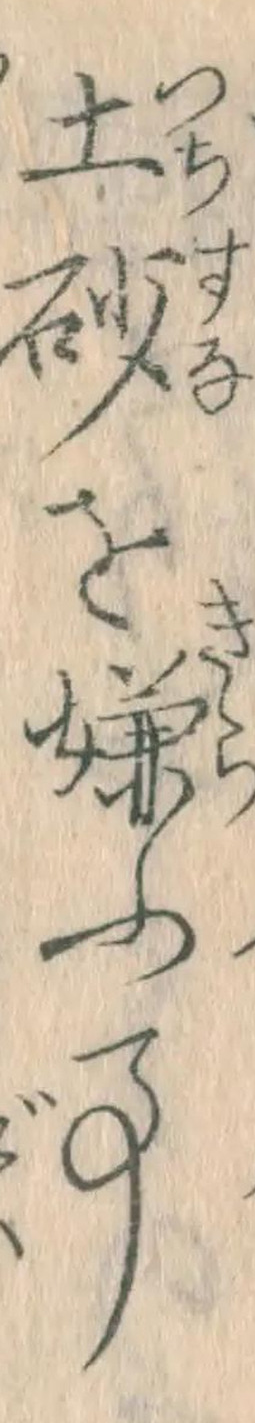土砂を嫌ふ事
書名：山繭養法秘傳抄
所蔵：国立国会図書館 National Diet Library, JAPAN
